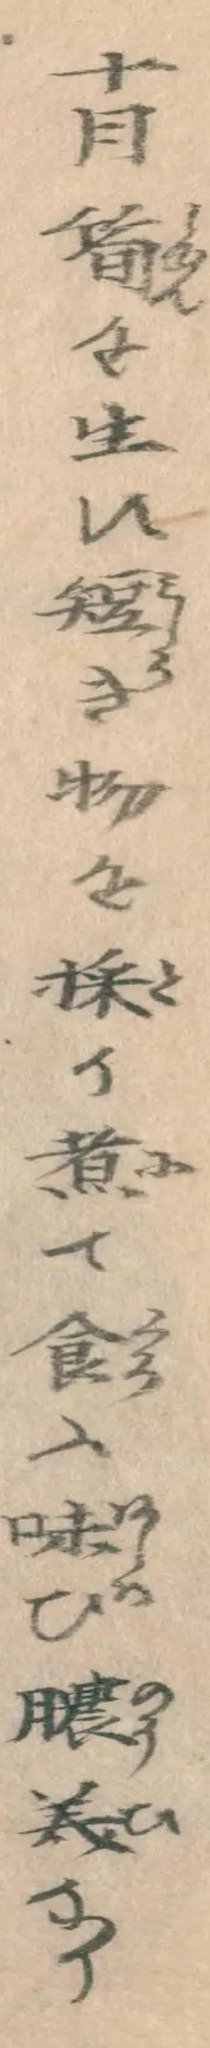十月筍を生す短き物を採り煮て食ふ味ひ膿美なり
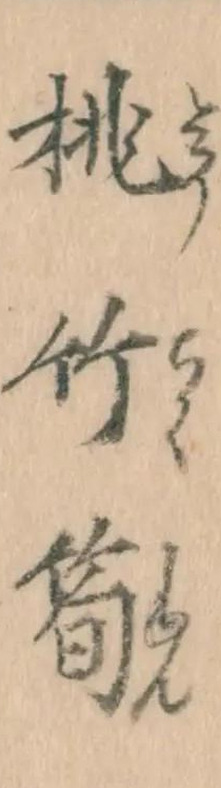剌竹筍
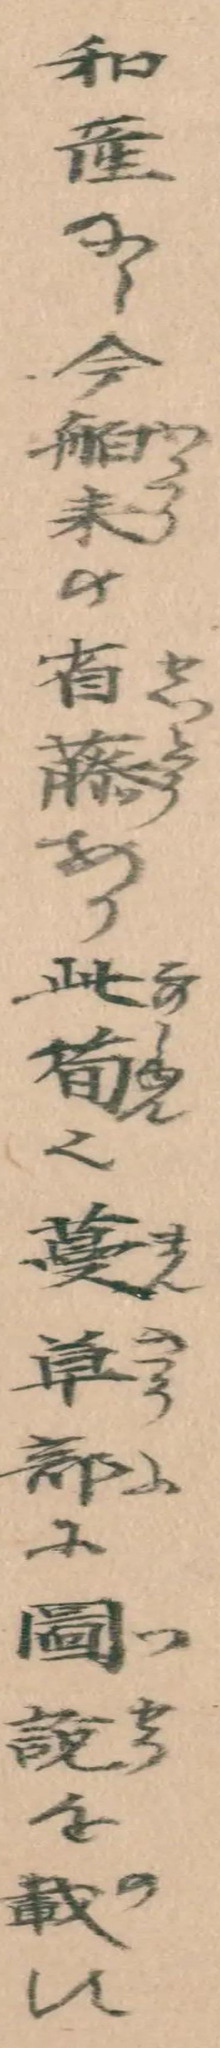和産なし今舶来の省藤あり此筍也蔓草部に図説を載す
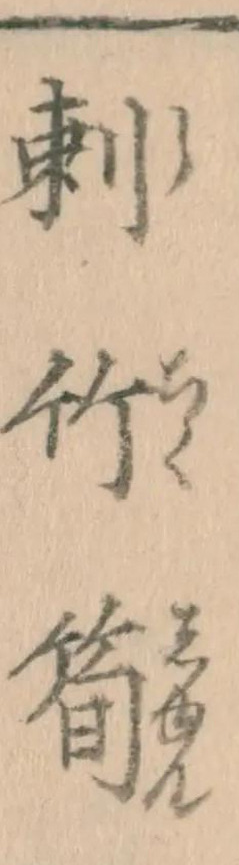剌竹筍
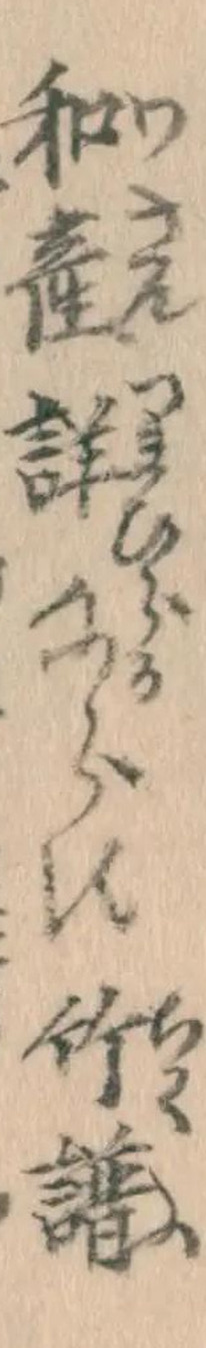和産詳ならす竹譜
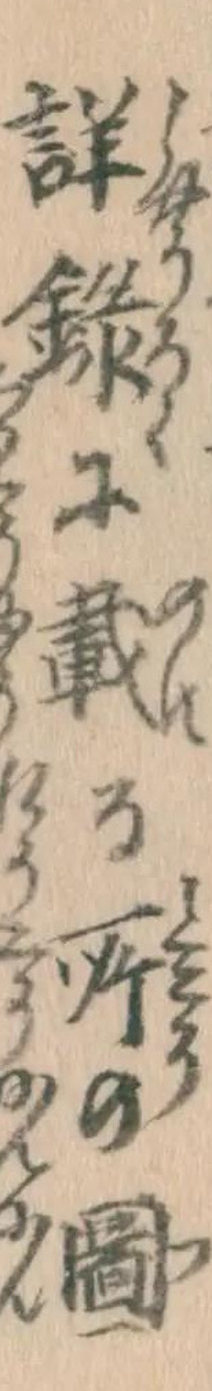詳録に載る所の図
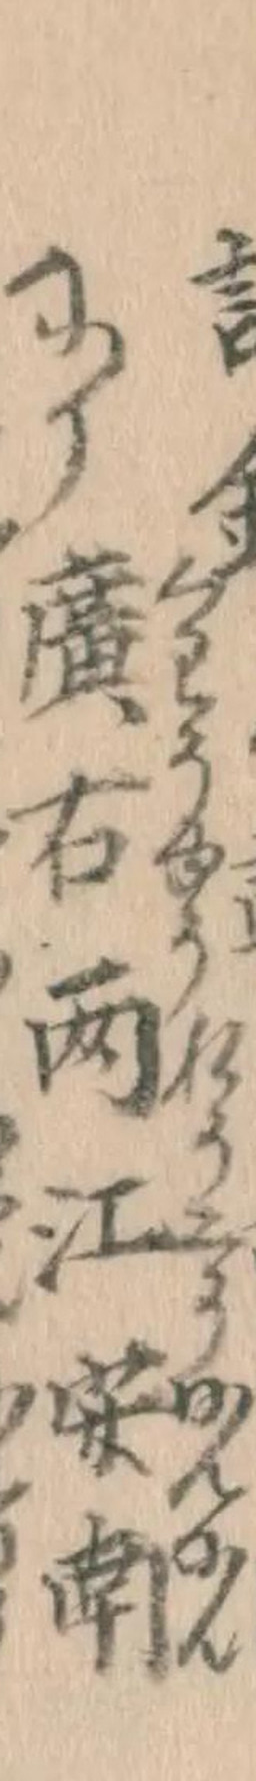なり広右両江安南
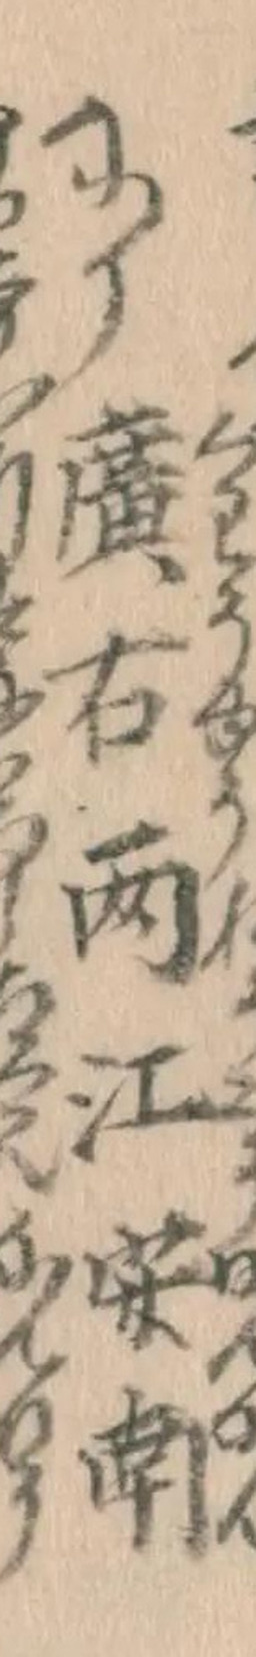なり広右両江安南
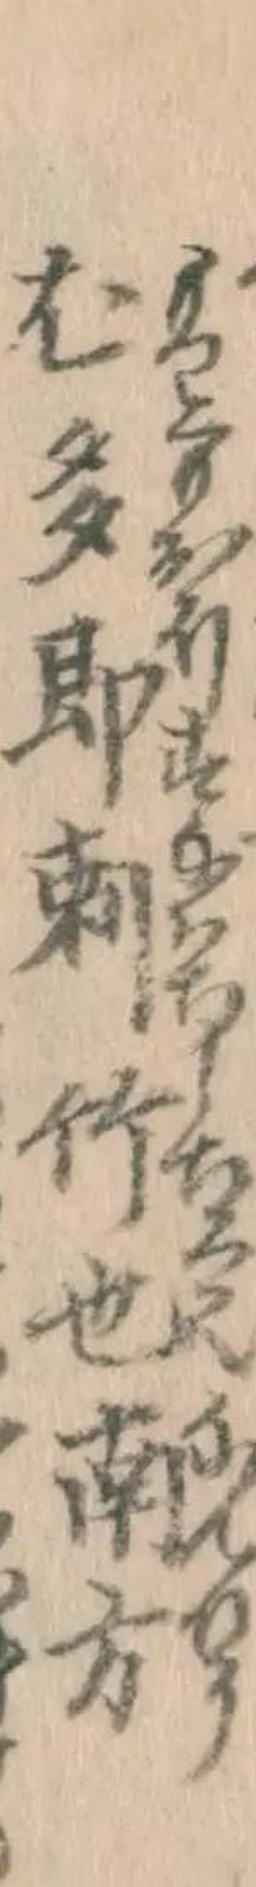尤多即剌竹也南方

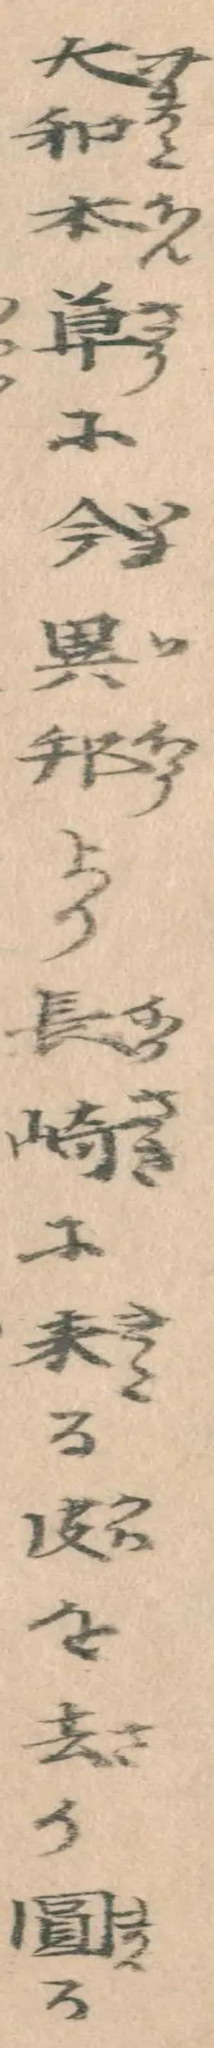大和本草に今異邦より長崎に来る皮を去り円か
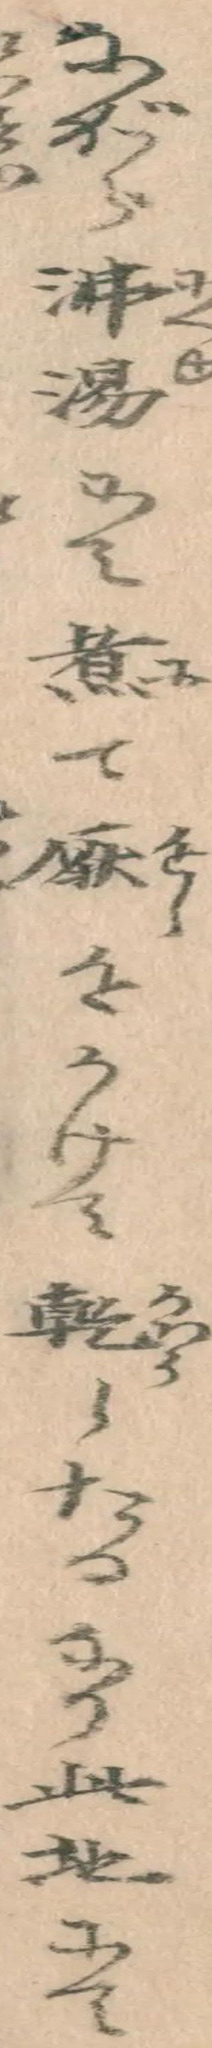ながら沸湯にて煮て厭をうけて乾したるなり此地にて
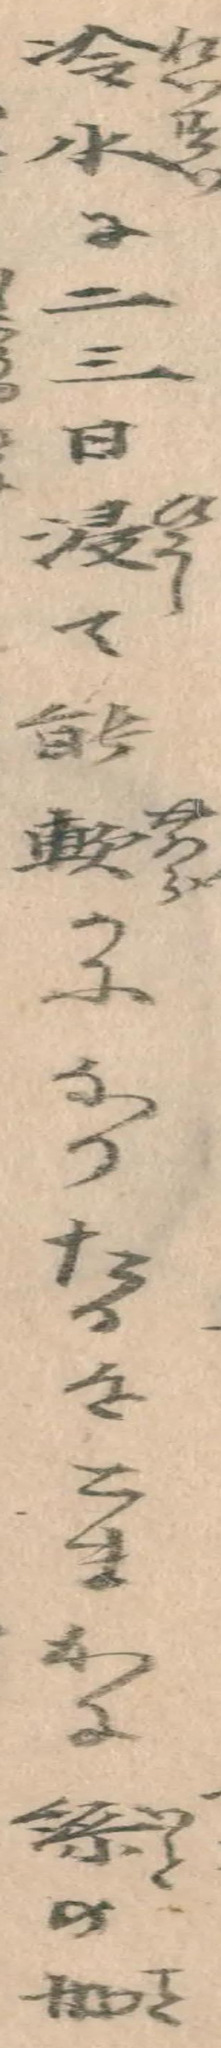冷水に二三日浸て能軟かになりたるをこまかに糸の如
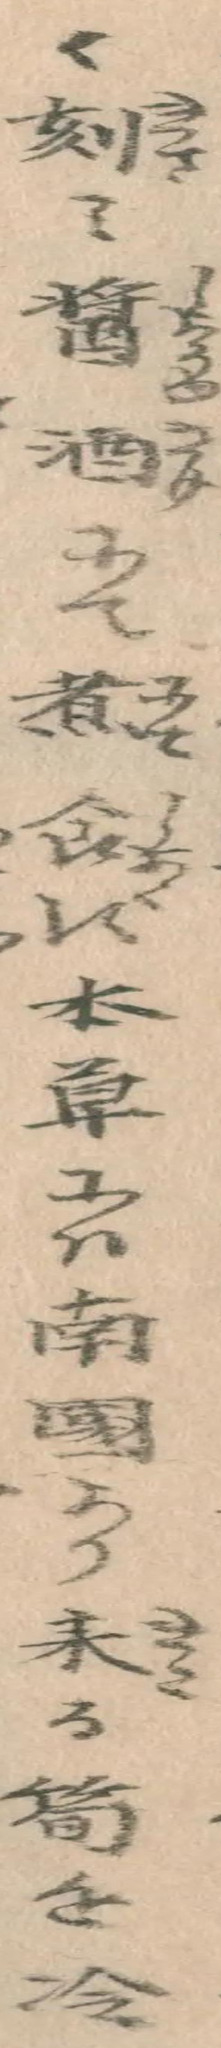く刻み醤酒にて煮食す本草には南国より来る筍を冷
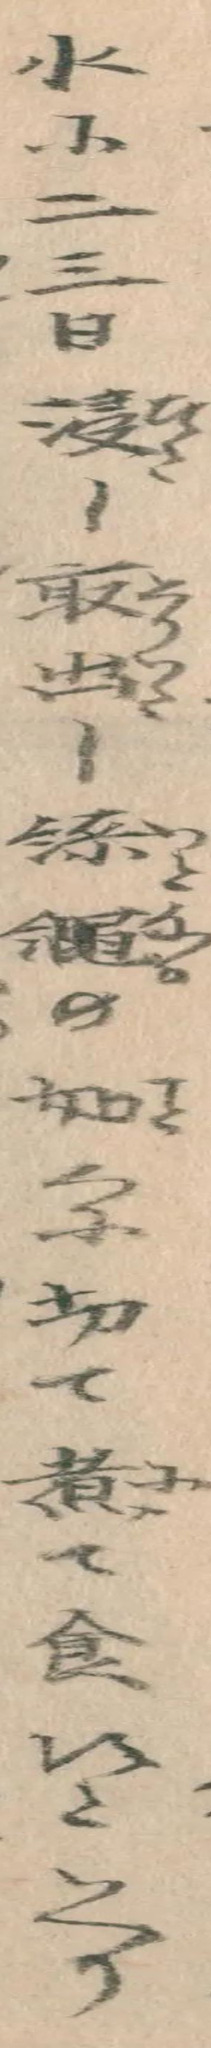水に二三日浸し取出し糸縄の如くに切て煮て食すといへり
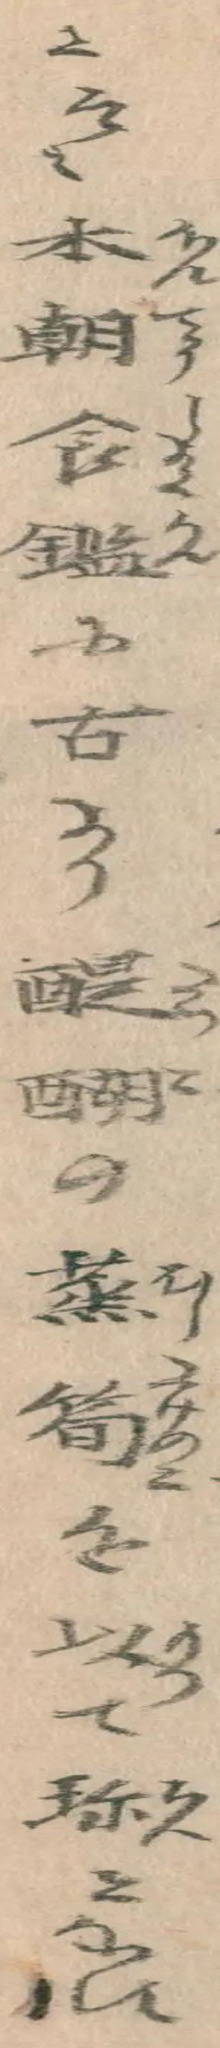と云〻本朝食鑑に古より醍醐の蒸筍を以て珎となす
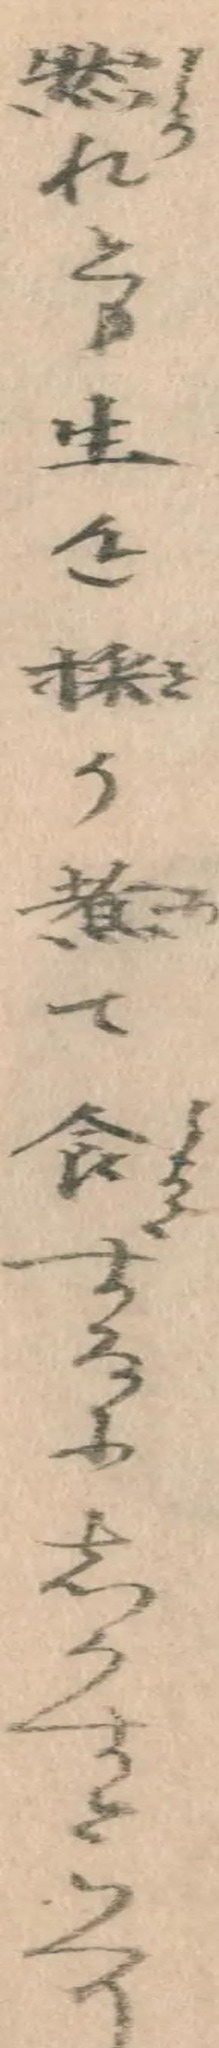然れとも生を採り煮て食するにしかすといへり
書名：本草図譜. 巻52-54
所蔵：国立国会図書館 National Diet Library, JAPAN
